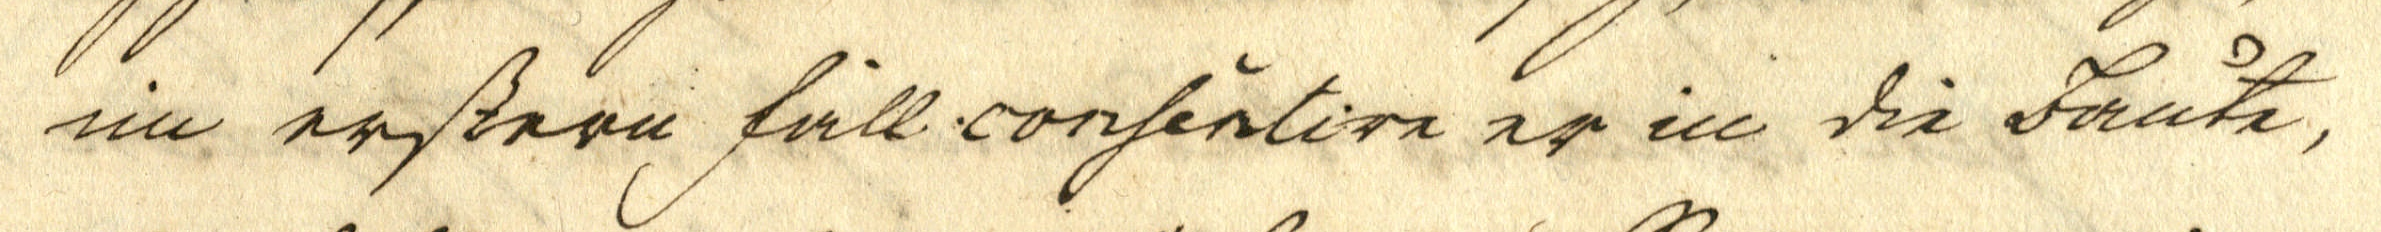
im ersten Fall consentire er in die Baute,
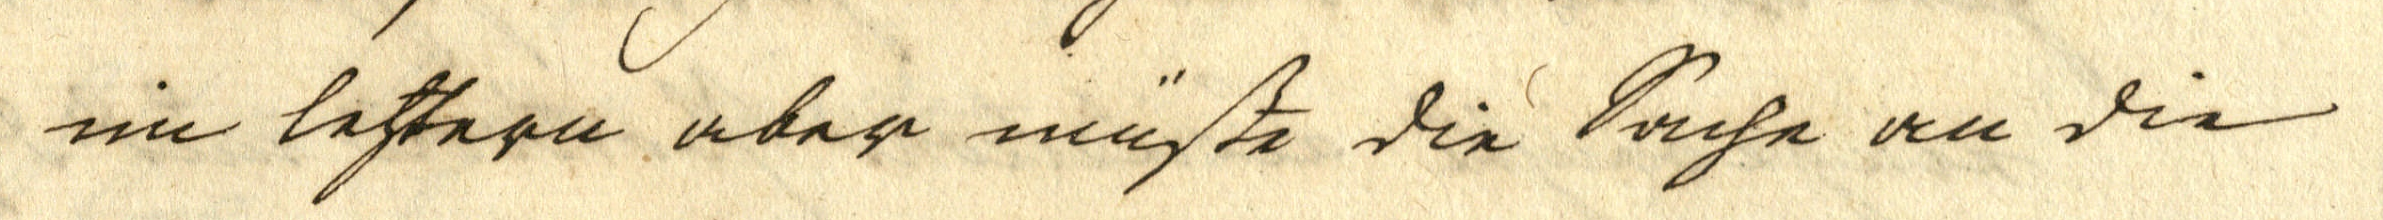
im letztern aber müßte die Sache an die
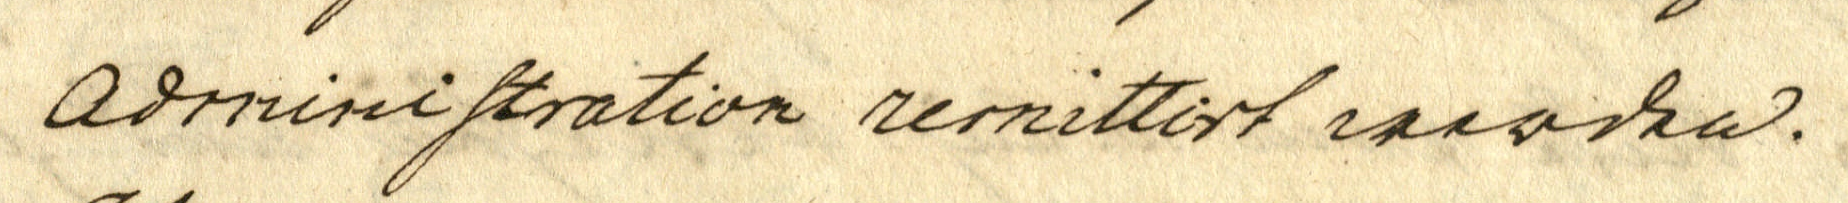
Administration remittirt werden.
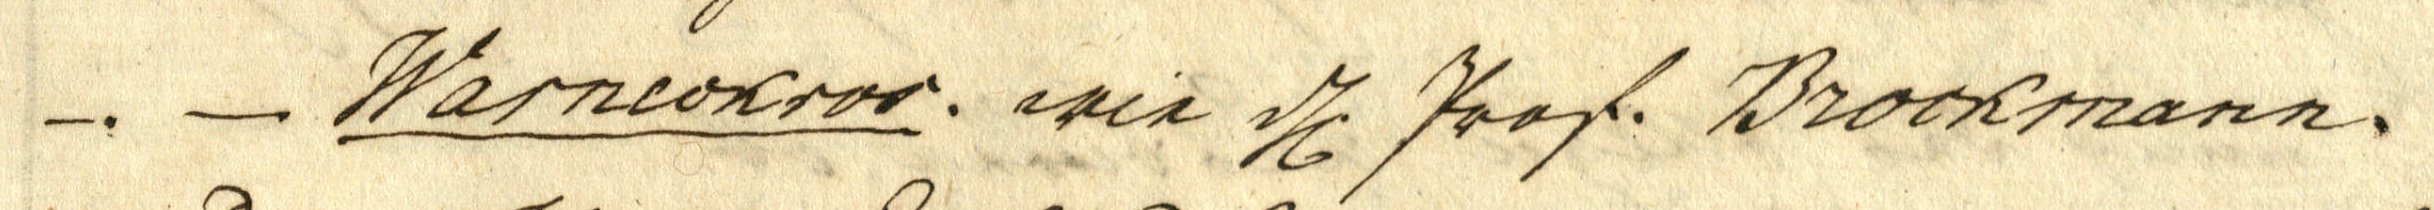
- " - Warneckros. wie dh. Prof. Brockmann.
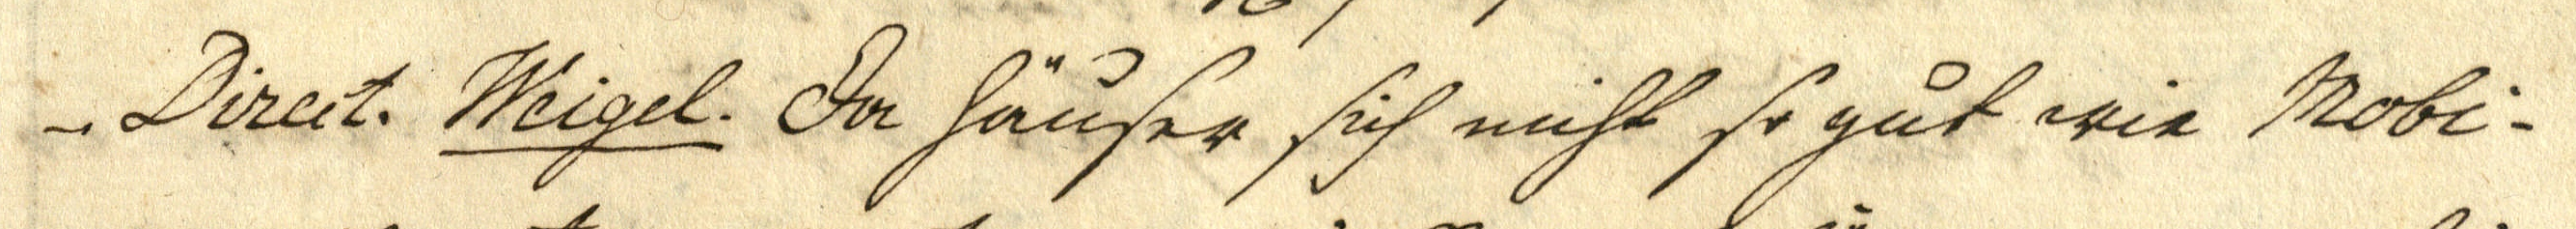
- Direct. Weigel. Da Häuser sich nicht so gut wie Mobi-
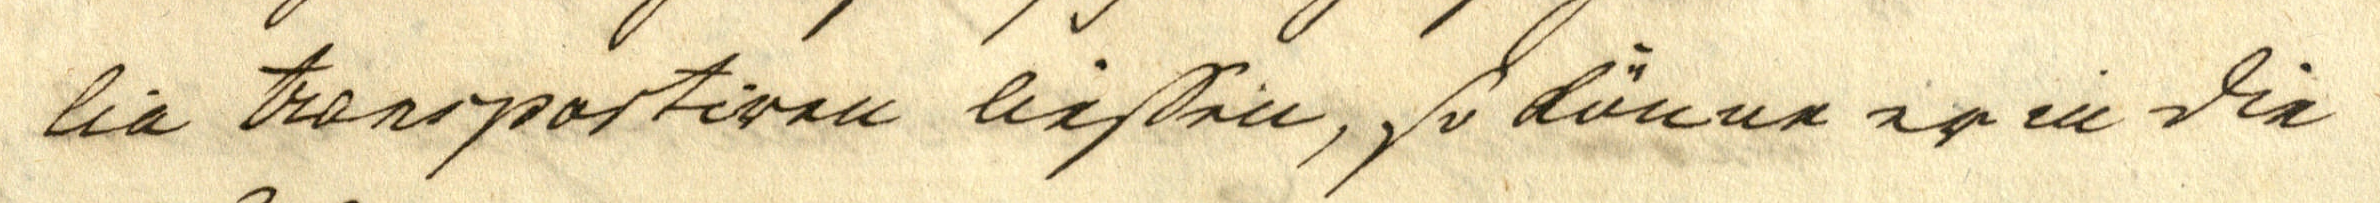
lia transportiren liessen, so könne er in die
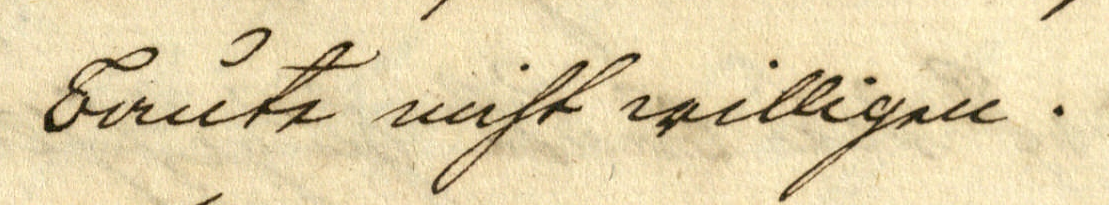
Baute nicht willigen.
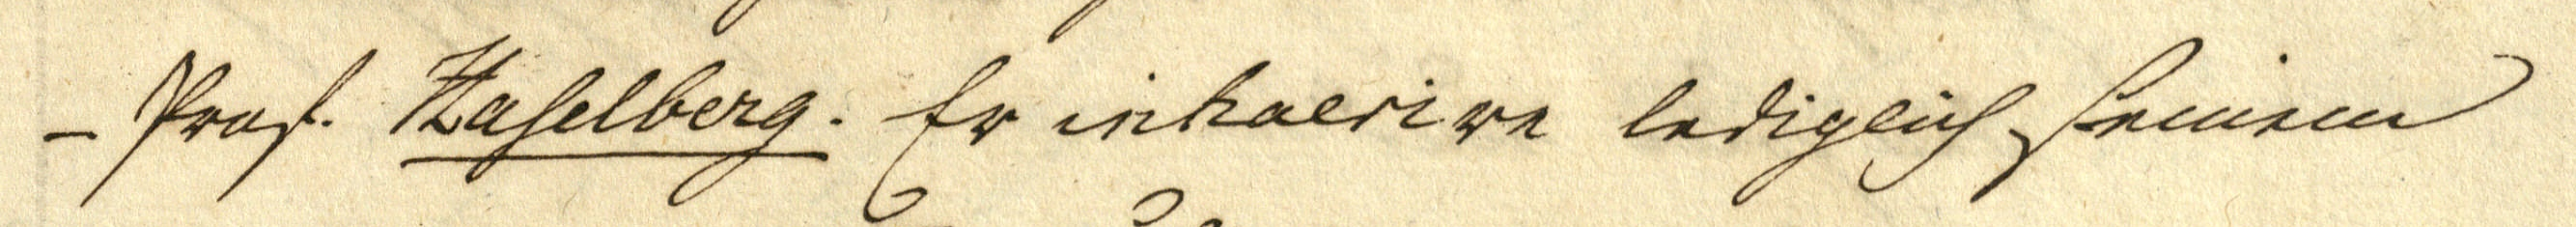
- Prof. Haselberg. Er inhaerire lediglich seinem
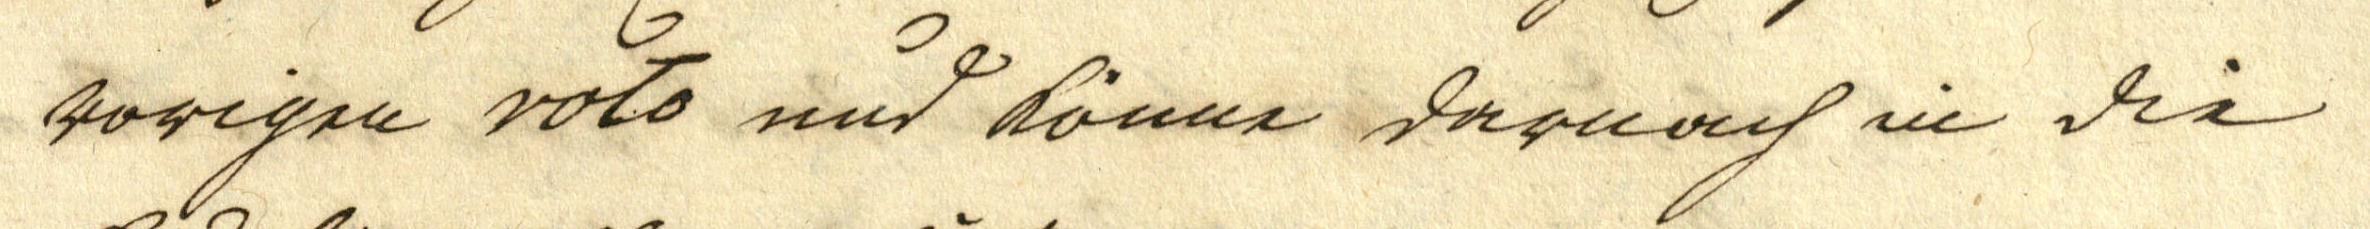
vorigen voto und könne darnach in die
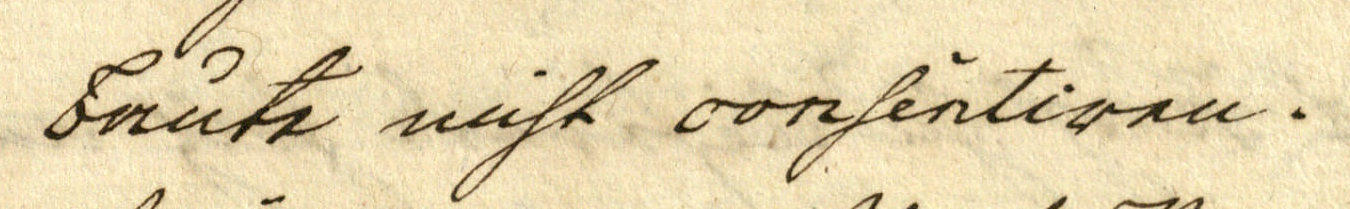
Baute nicht consentiren.
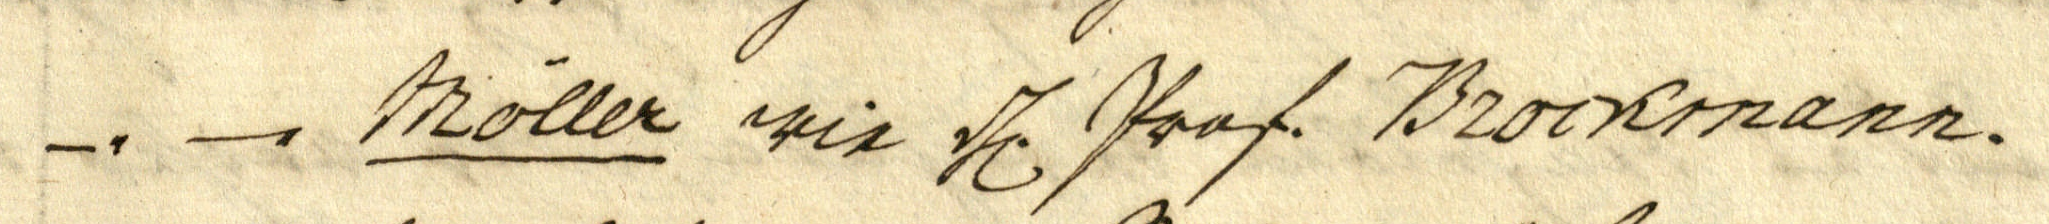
- - Möller wie dh. Prof. Brockmann.
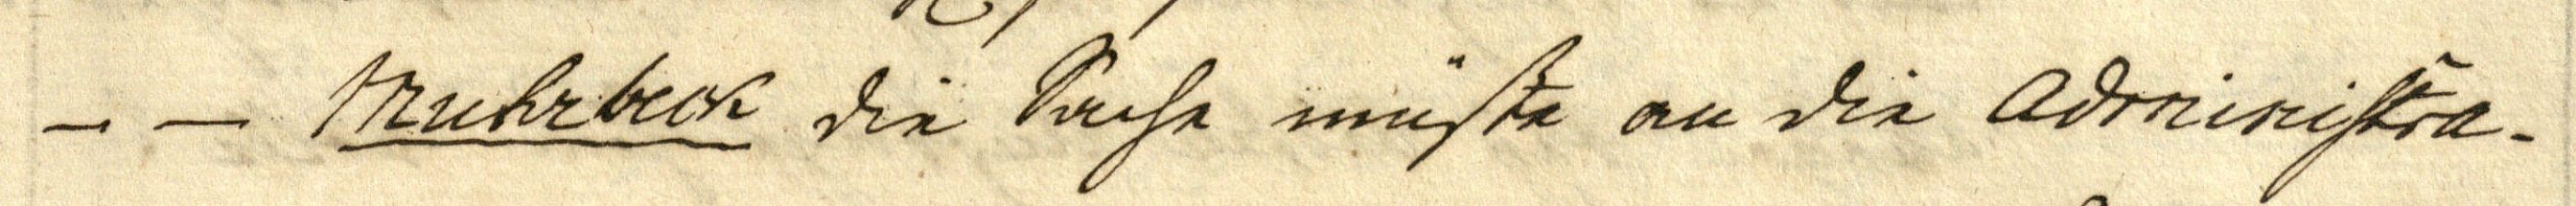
- - Muhrbeck die Sache müßte an die Administra-
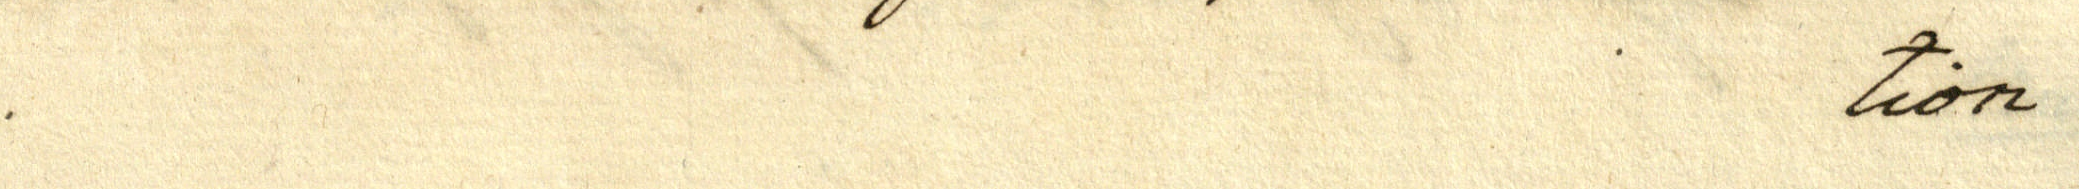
tion
